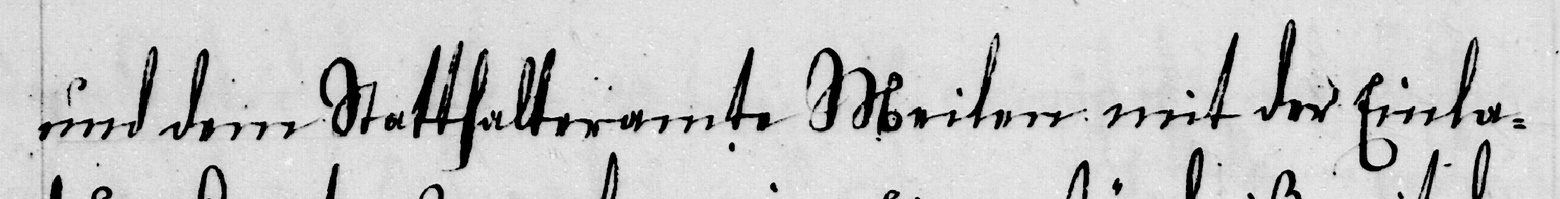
und dem Statthalteramte Meilen mit der Einla¬
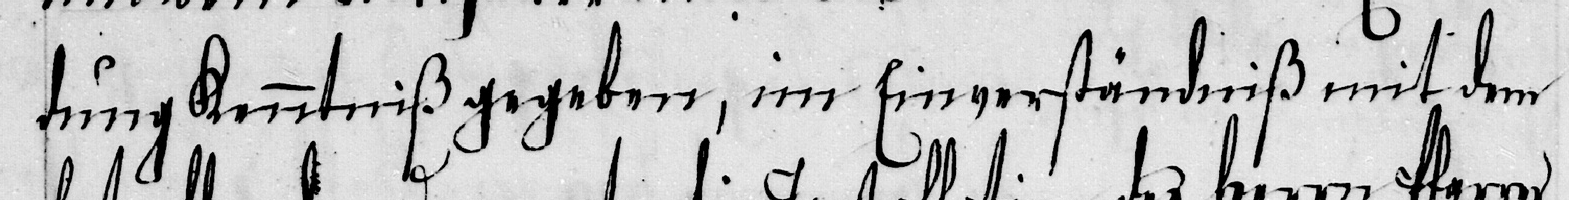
dung Kenntniß gegeben, im Einverständniß mit dem
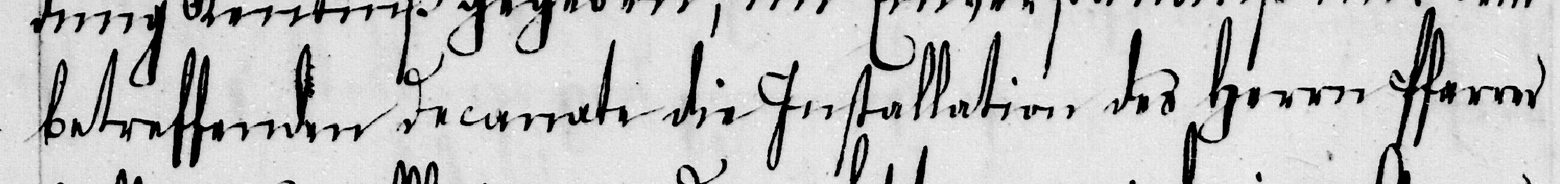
betreffenden Decanate die Installation des Herrn Pfarr¬
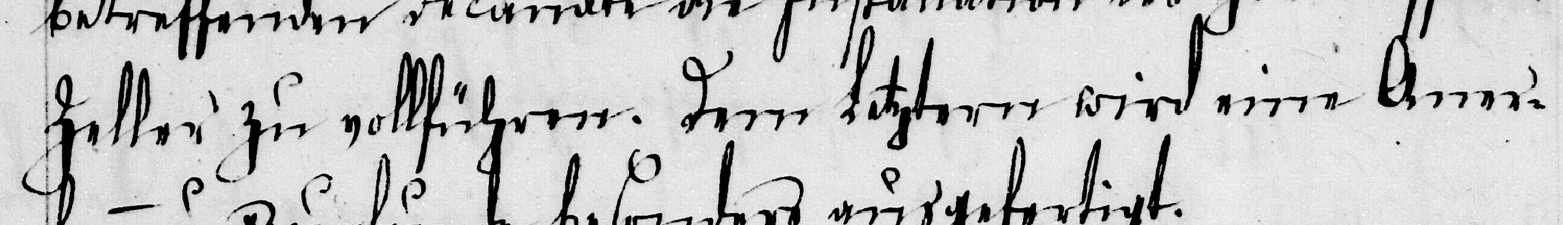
Zeller zu vollführen. Dem Letztern wird eine Aner¬
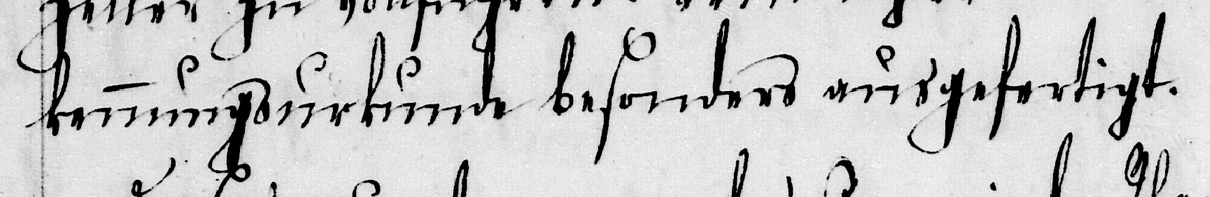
kennungsurkunde besonders ausgefertigt.
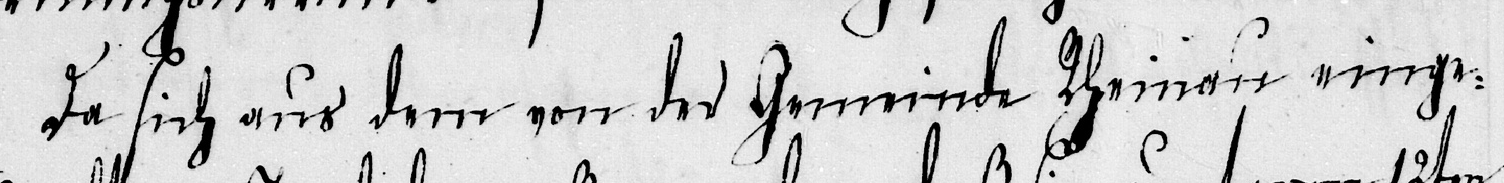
Da sich aus dem von der Gemeinde Rheinau einge¬
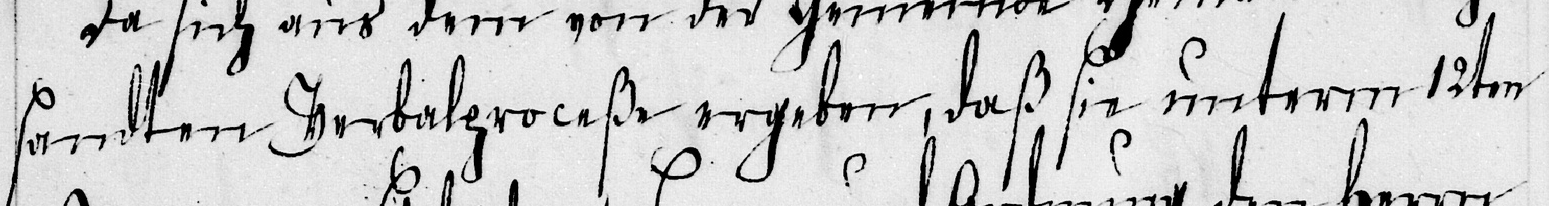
sandten Verbalproceße ergeben, daß sie unterm 12ten
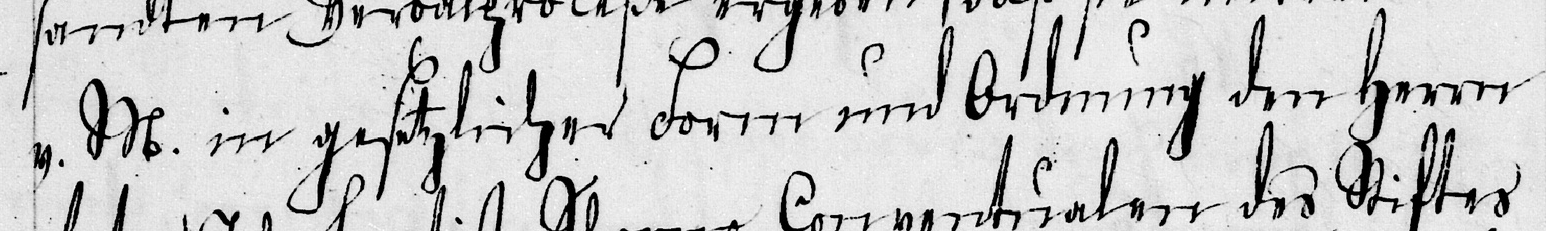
v. M. in gesetzlicher Form und Ordnung den Herrn
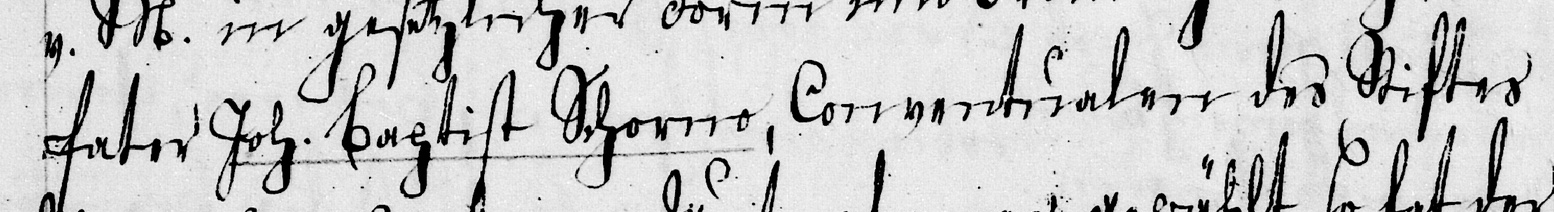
Pater Joh. Baptist Schorno, Conventualen des Stiftes
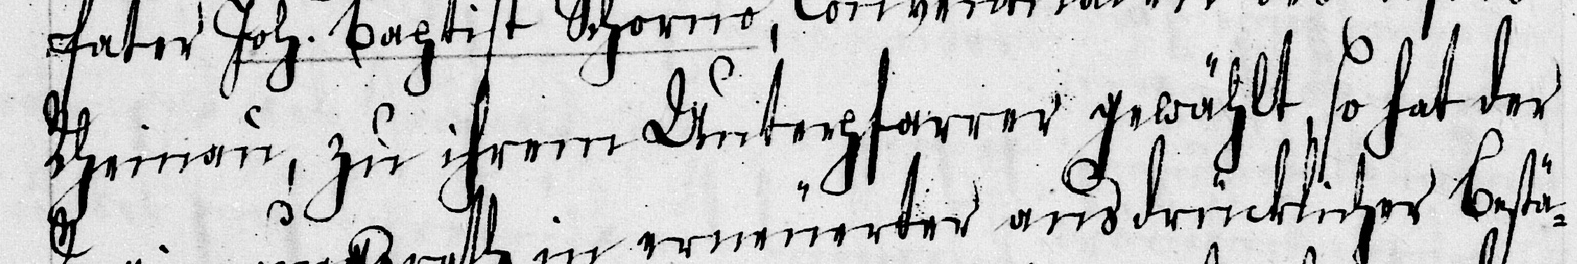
Rheinau, zu ihrem Unterpfarrer gewählt, so hat der
